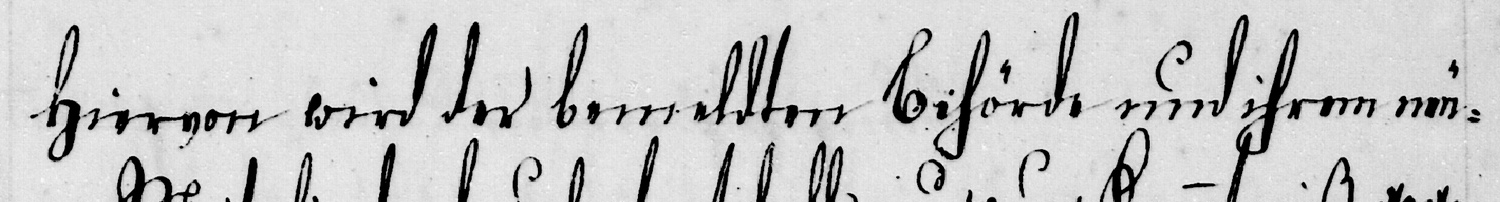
Hiervon wird der bemeldten Behörde und ihrem neu¬
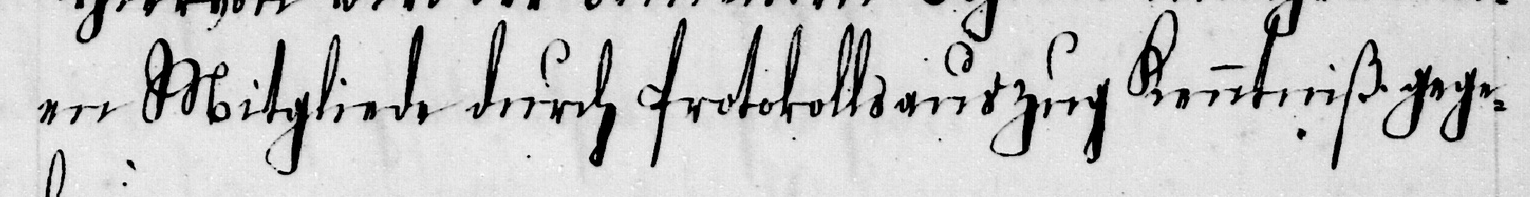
en Mitgliede durch Protokollsauszug Kenntniß gege¬
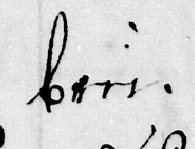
ben.
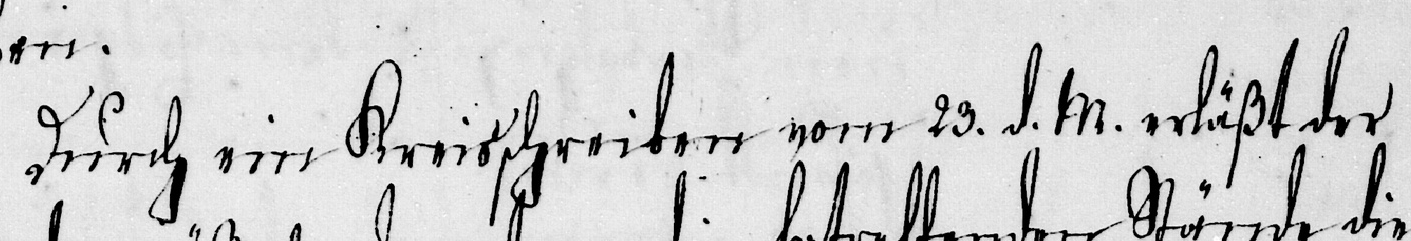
Durch ein Kreisschreiben vom 23. d. M. erläßt der
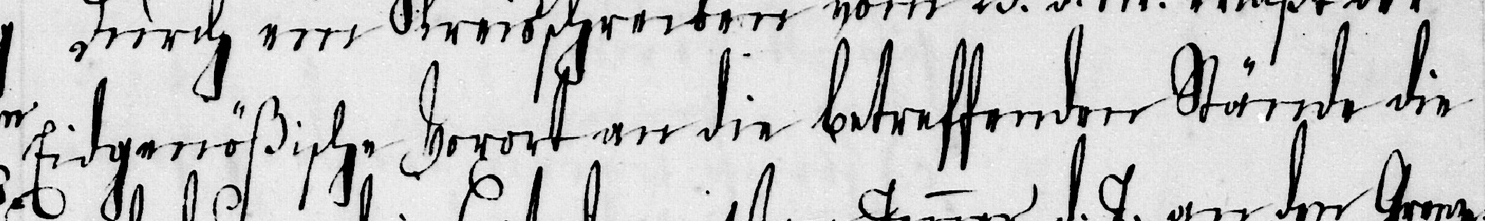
Eidgenößische Vorort an die betreffenden Stände die
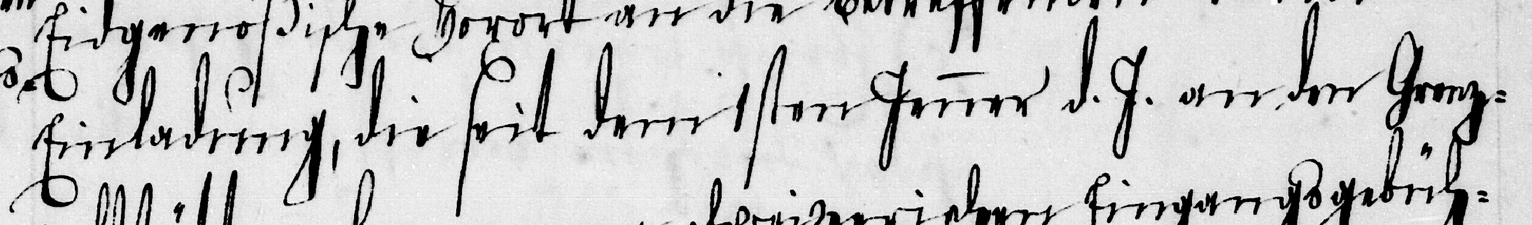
Einladung, die seit dem 1sten Jenner d. J. an den Grenz¬
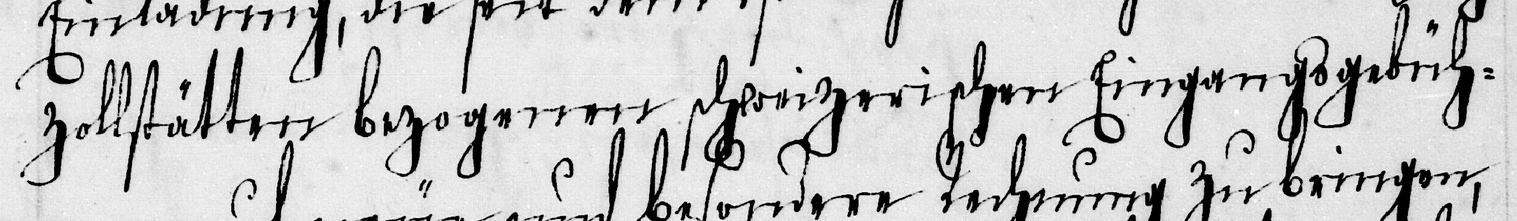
zollstätten bezogenen schweizerischen Eingangsgebüh¬
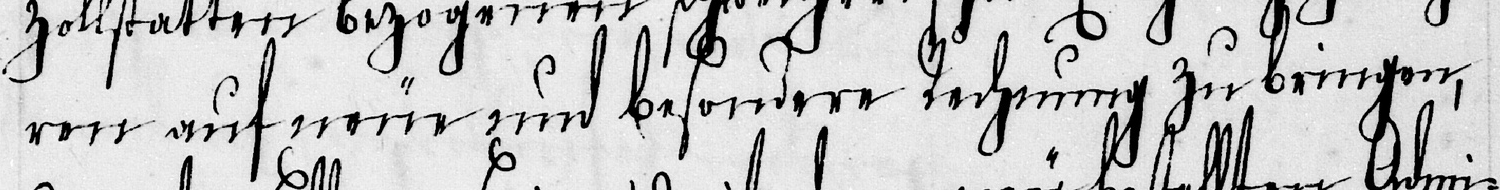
ren auf neue und besondere Rechnung zu bringen,
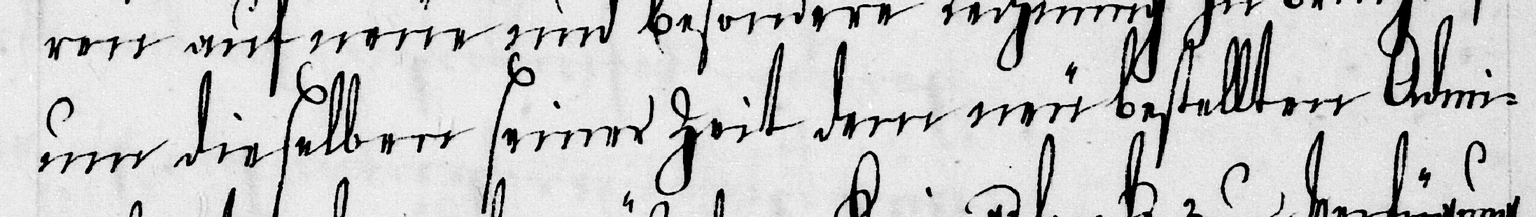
um dieselbe seiner Zeit dem neu bestellten Admi¬
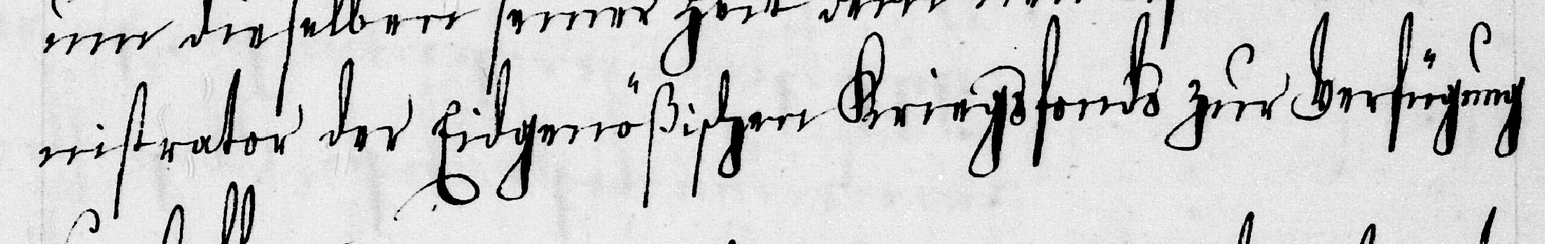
nistrator der Eidgenößischen Kriegsfonds zu Verfügung
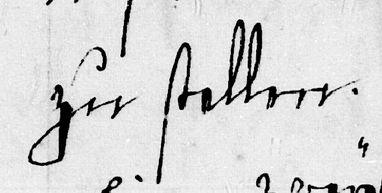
zu stellen.
